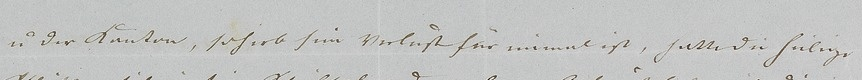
u der Kanton, so herb sein Verlust für einmal ist, hatte die heilige
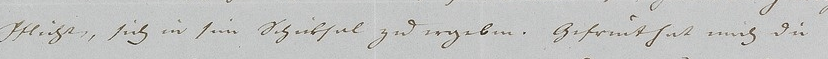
Pflicht, sich in sein Schicksal zu ergeben. Gefreut hat mich die
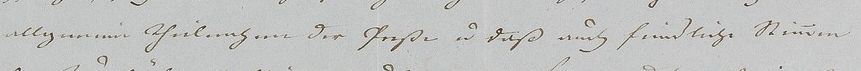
allgemeine Theilnahme der Preße u daß auch feindliche Stimmen
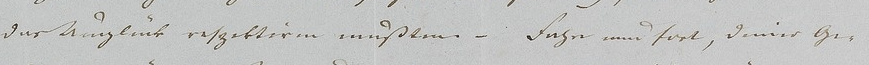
das Unglück respektiren mußten. – Fahre nun fort, deiner Ge-
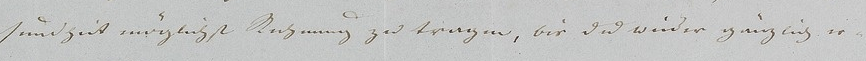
sundheit möglichst Rechnung zu tragen, bis du wieder gänzlich er-
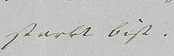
starkt bist.
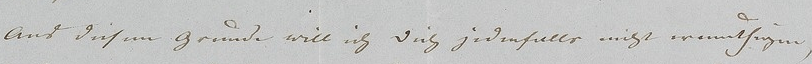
Aus diesem Grunde will ich Dich jedenfalls nicht ermuthigen,
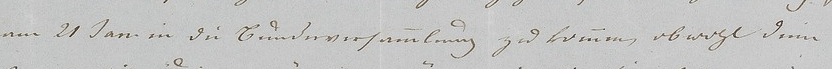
am 21 Jan. in die Bundesversammlung zu kommen, obwohl deine
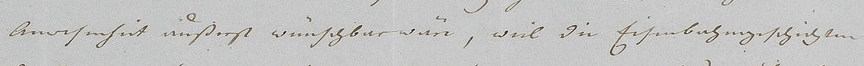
Anwesenheit äußerst wünschbar wäre, weil die Eisenbahngeschichten
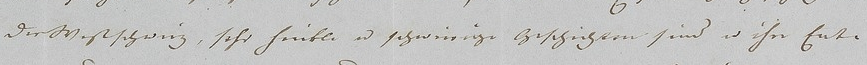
der Westschweiz, sehr heickle u schwierige Geschichten sind u ihre Ent-
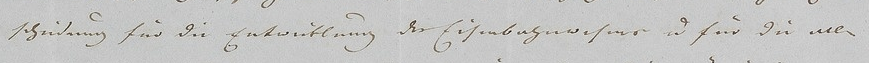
scheidung für die Entwicklung des Eisenbahnwesens u für die all-
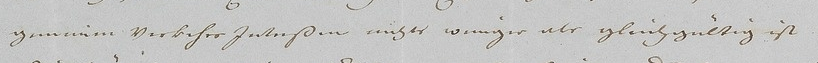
gemeinen Verkehrs Intreßen nichts weniger als gleichgültig ist.
